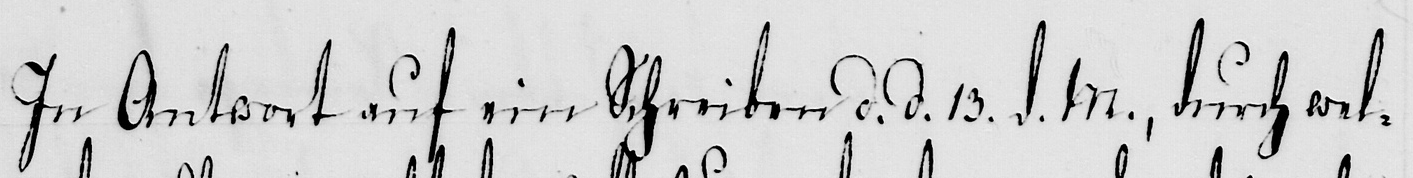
In Antwort auf ein Schreiben d. d. 13. d. M., durch we¬
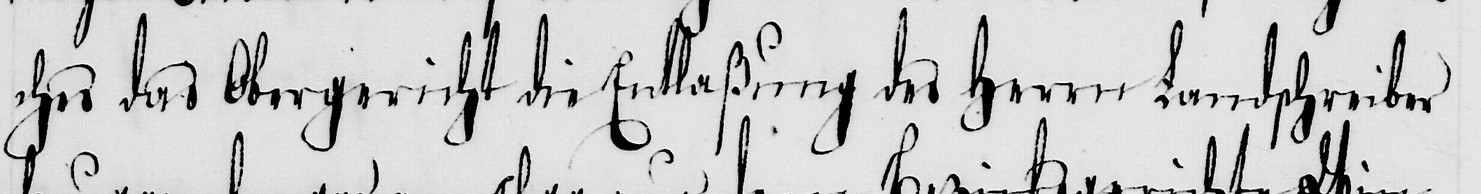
ches das Obergericht die Entlaßung des Herrn Landschreiber
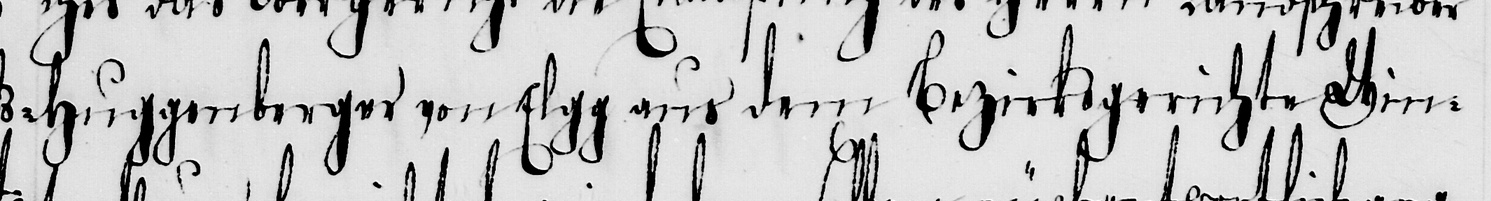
Huggenberger von Elgg aus dem Bezirksgerichte Win¬
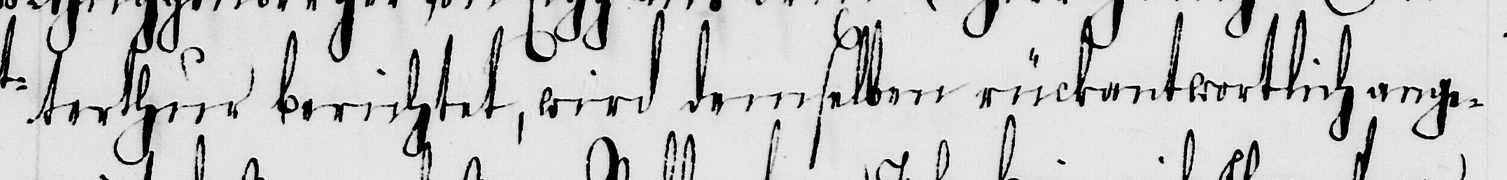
terthur berichtet, wird demselben rückantwortlich ange¬
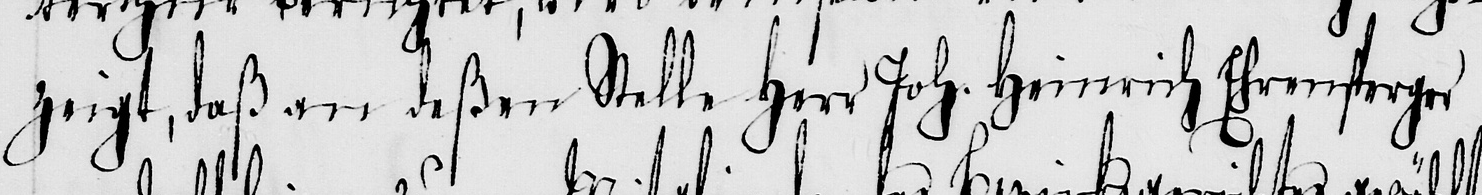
zeigt, daß an deßen Stelle Herr Joh. Heinrich Ehrensperger
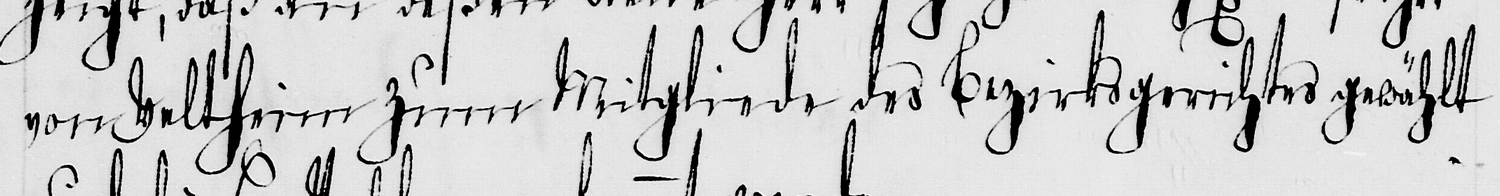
von Veltheim zum Mitgliede des Bezirksgerichtes gewählt
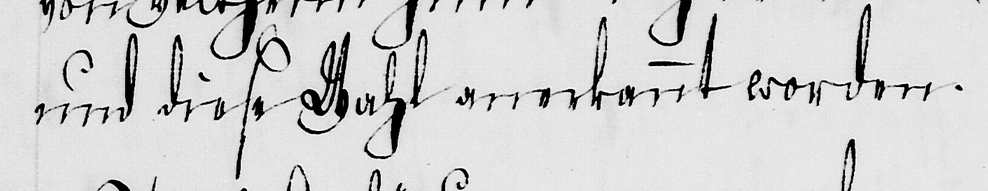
und diese Wahl anerkannt worden.
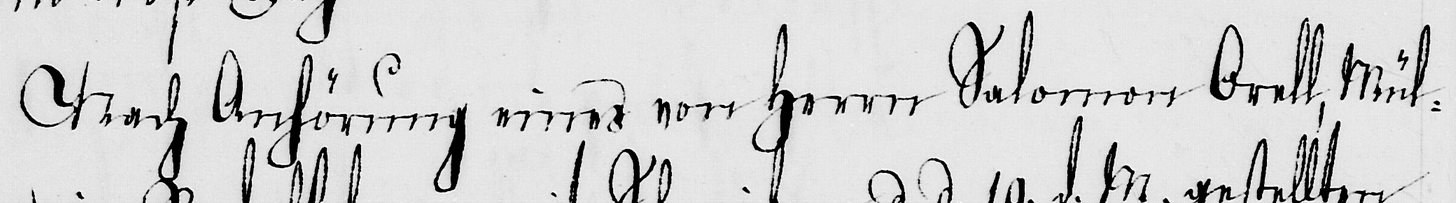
Nach Anhörung eines von Herrn Salomon Orell, Mül¬
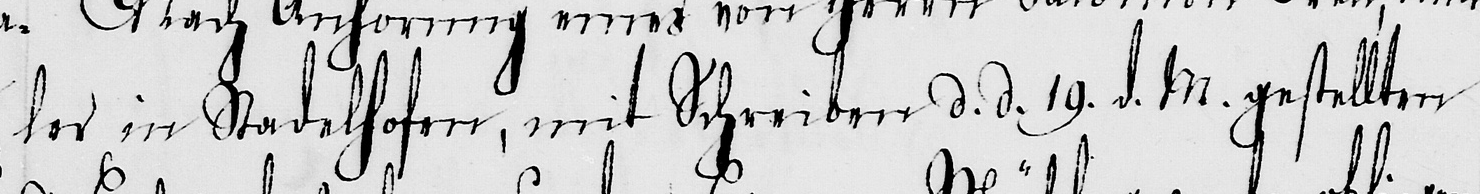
ler in Stadelhofen, mit Schreiben d. d. 19. d. M. gestellten
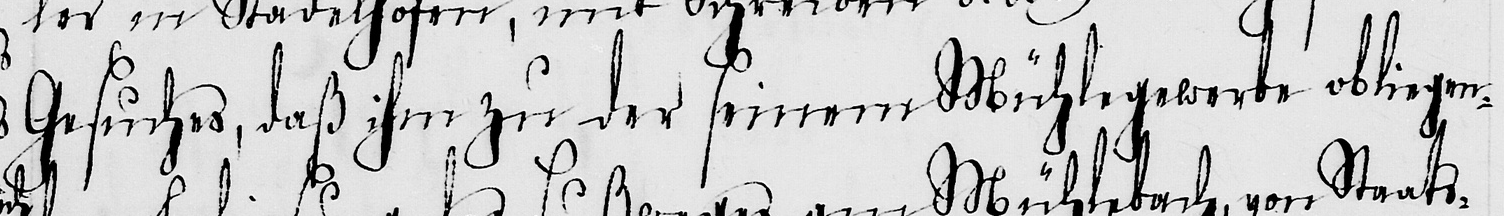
Gesuches, daß ihm zu der seinem Mühlegewerbe obliege¬
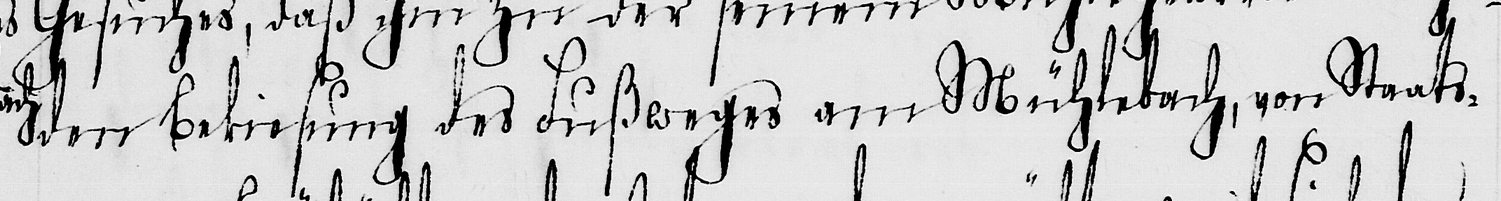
nden Bekiesung des Fußweges am Mühlebach, von Staats¬
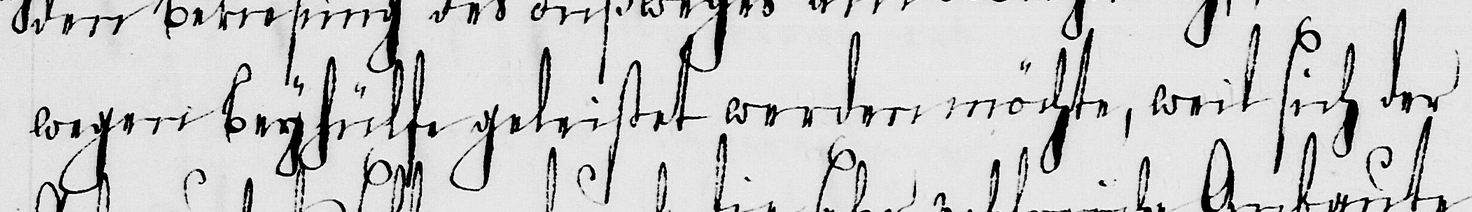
wegen Beyhülfe geleistet werden möchte, weil sich der
